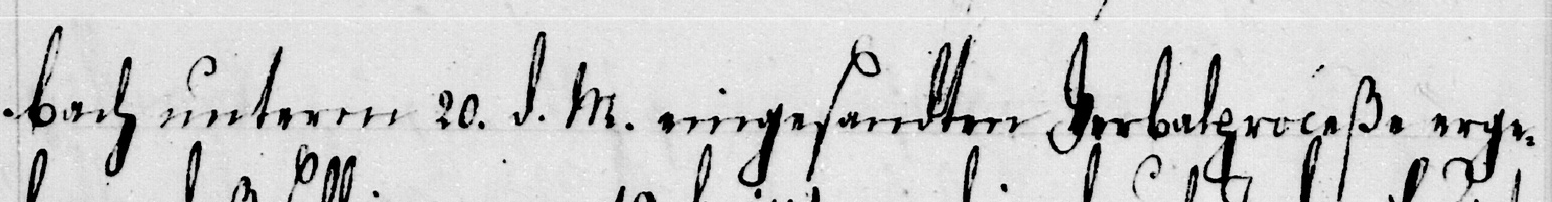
bach unterm 20. d. M. eingesandten Verbalproceße erge¬
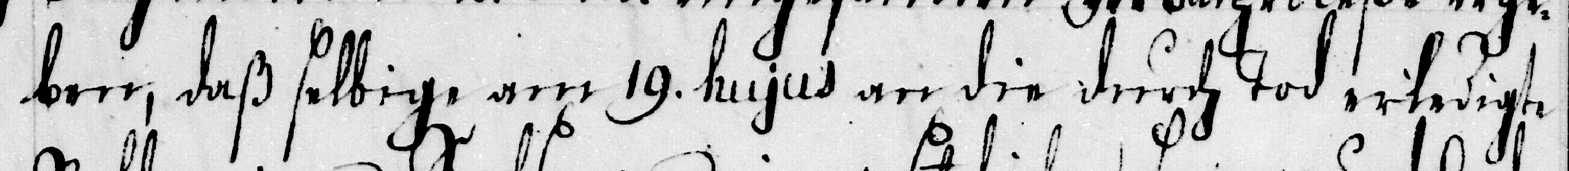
ben, daß selbige am 19. hujus an die durch Tod erledigte
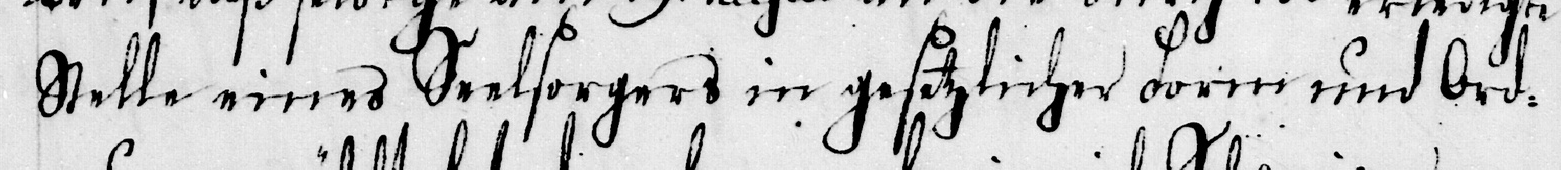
Stelle eines Seelsorgers in gesetzlicher Form und Ord¬
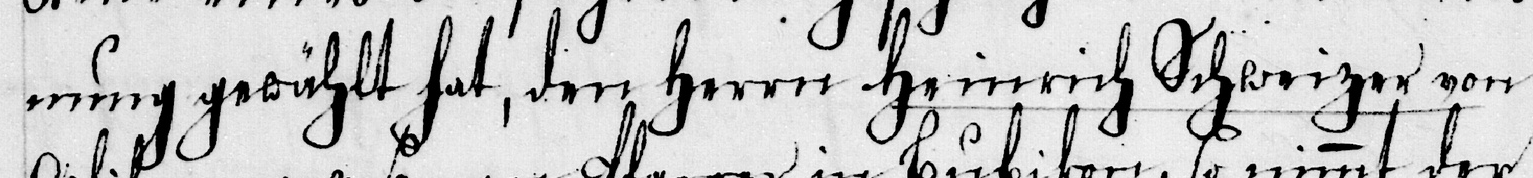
nung gewählt hat, den Herrn Heinrich Schweizer von
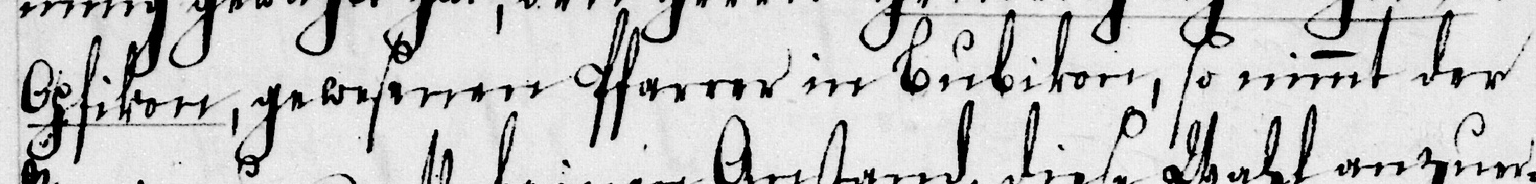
Opfikon, gewesenen Pfarrer in Bubikon, so nimmt der
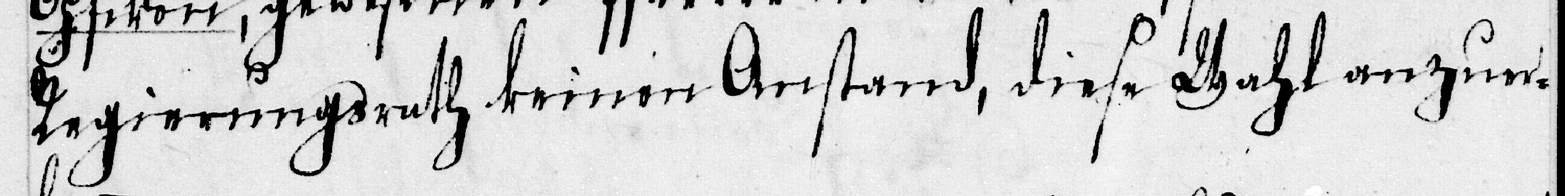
Regierungsrath keinen Anstand, diese Wahl anzuer¬
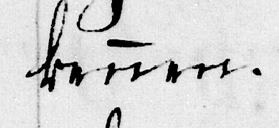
kennen.
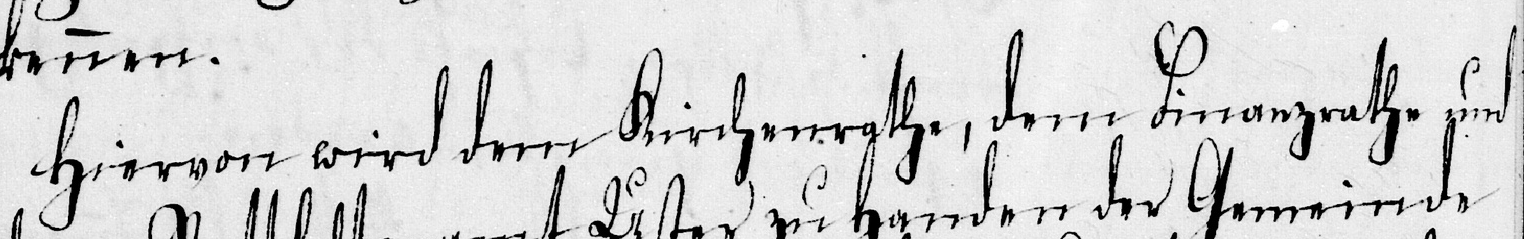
Hiervon wird dem Kirchenrath, dem Finanzrathe und
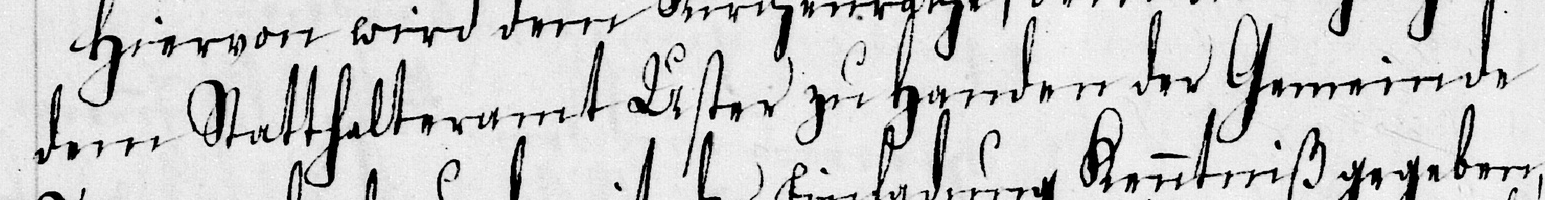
dem Statthalteramt Uster zu Handen der Gemeinde
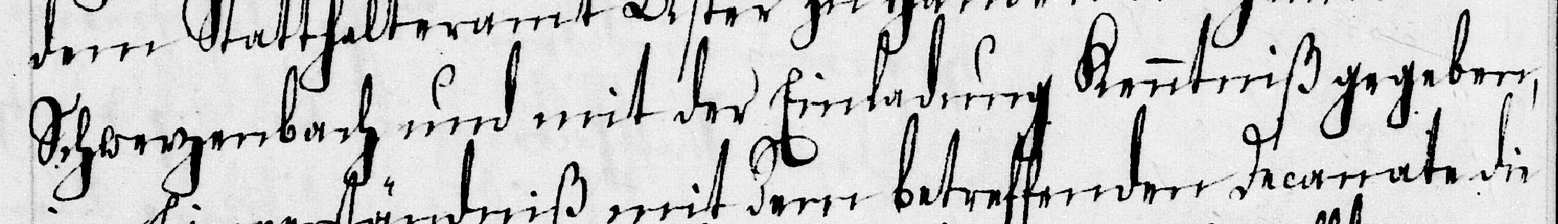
Schwerzenbach und mit der Einladung Kenntniß gegeben,
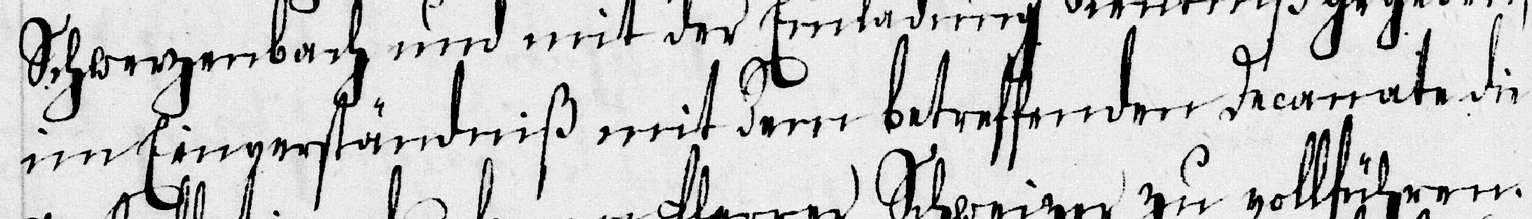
im Einverständniß mit dem betreffenden Decanate die
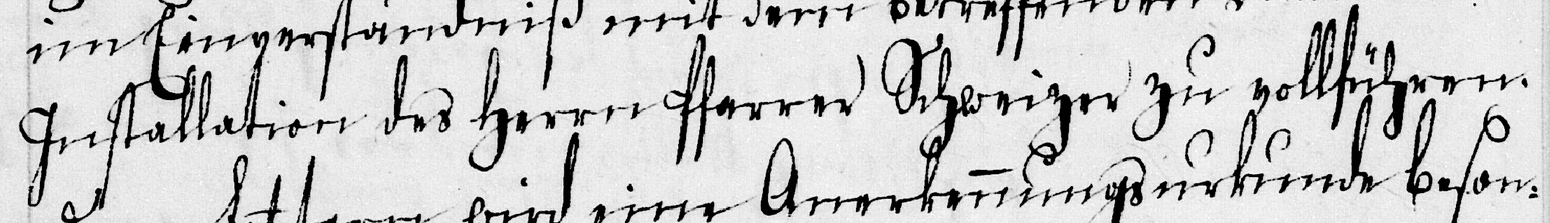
Installation des Herrn Pfarrer Schweizer zu vollführen.
